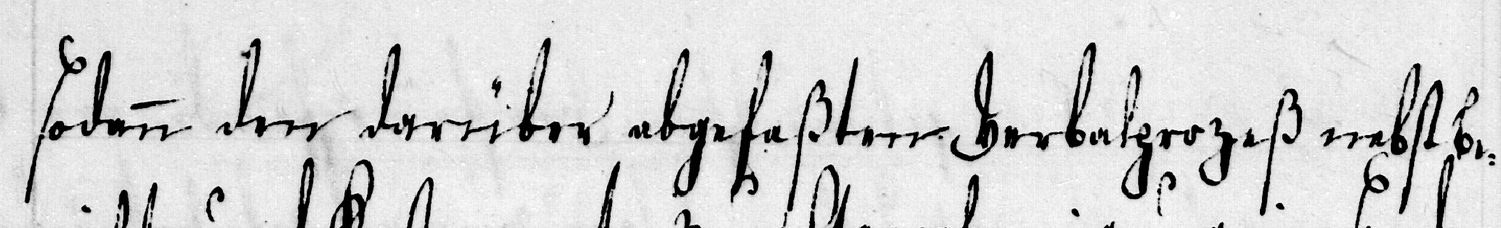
sodann den darüber abgefaßten Verbalprozeß nebst
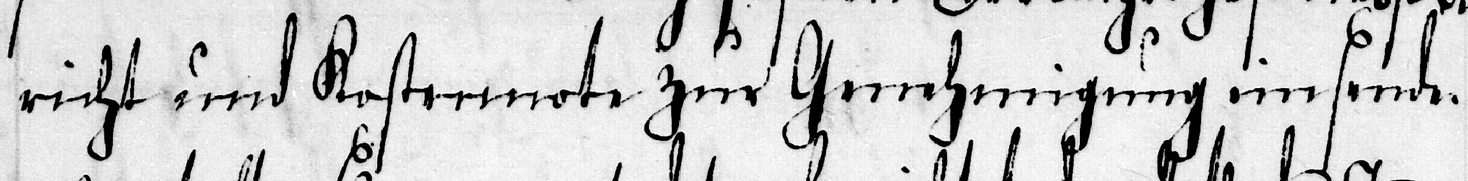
richt und Kostennote zur Genehmigung einsende.
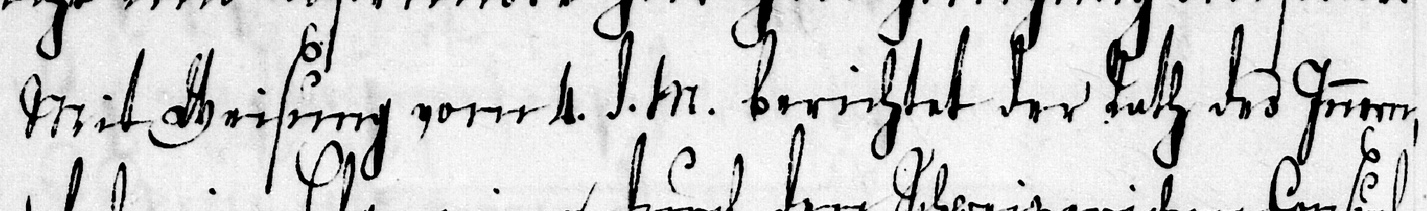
Mit Weisung vom 4. d. M. berichtet der Rath des Inn¬
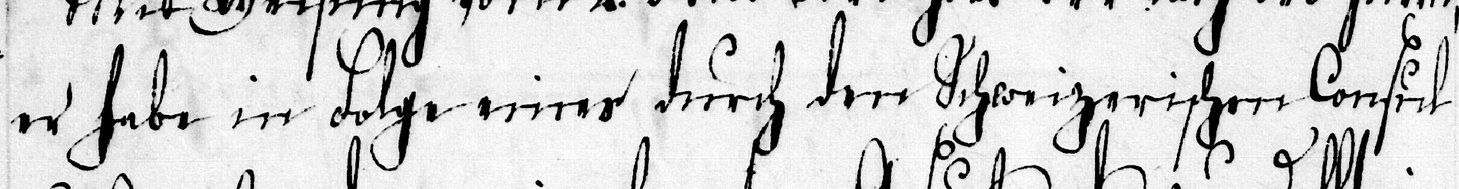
er habe in Folge eines durch den Schweizerischen Consul
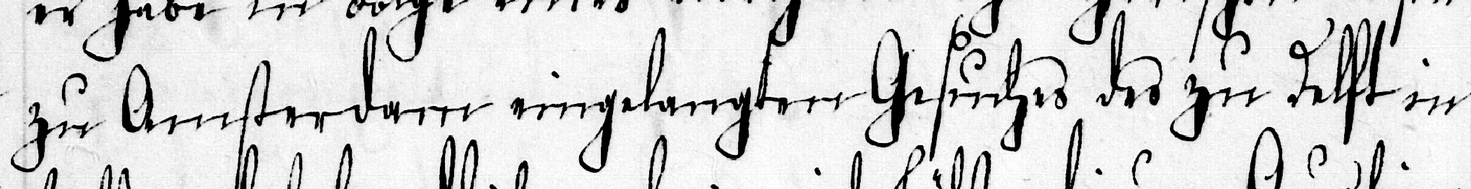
zu Amsterdam eingelangten Gesuches des zu Delft in
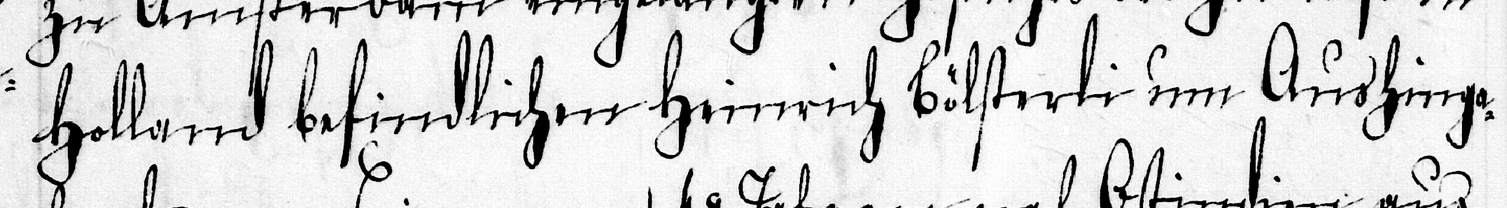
Holland befindlichen Heinrich Bölsterli um Aushing¬
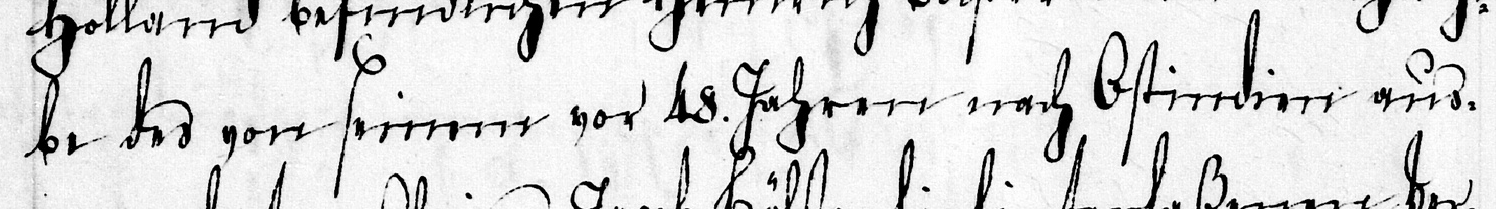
abe des von seinem vor 48. Jahren nach Ostindien aus¬
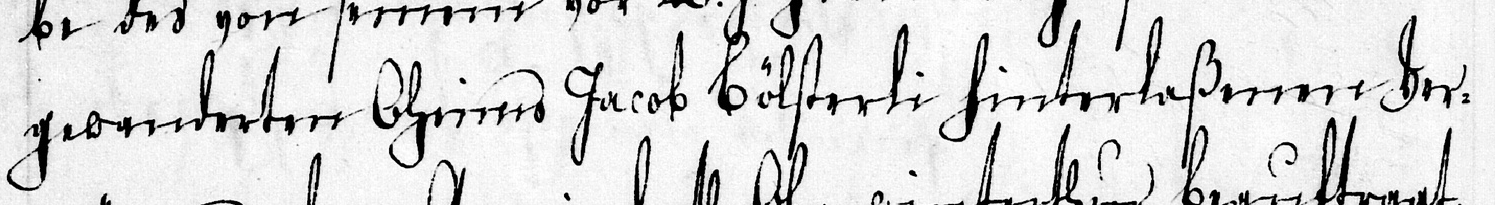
gewanderten Oheims Jacob Bölsterli hinterlaßenen Ver¬
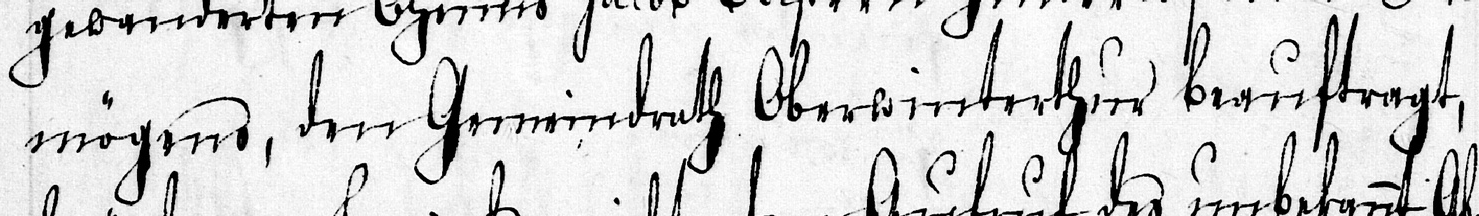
mögens, den Gemeindrath Oberwinterthur beauftragt,
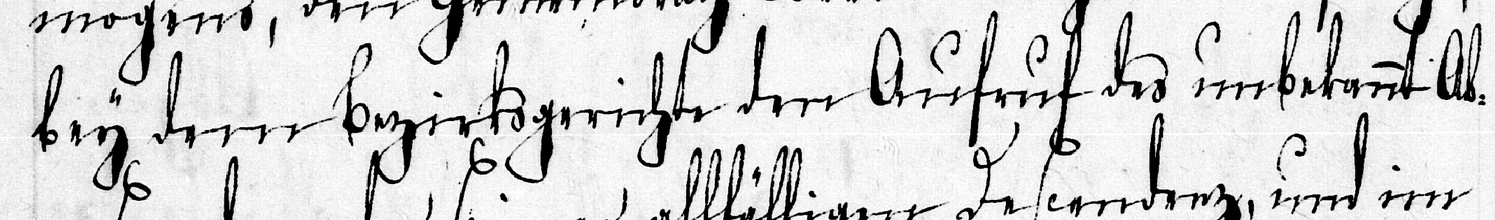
bey dem Bezirksgerichte den Aufruf des unbekannt Ab¬
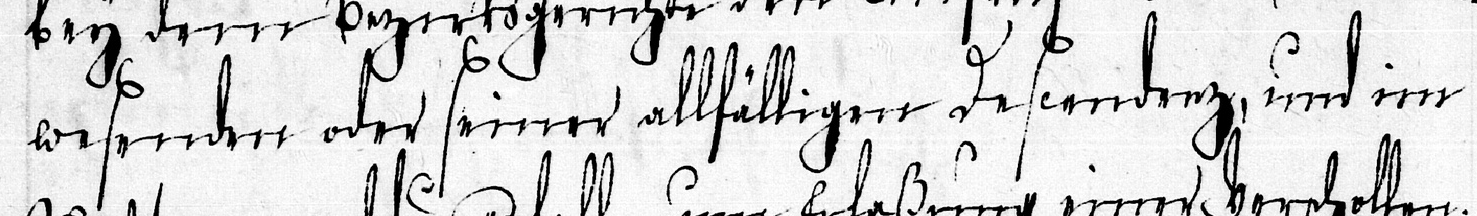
wesenden oder seiner allfälligen Descendenz, und im
